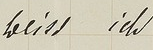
weiss ich
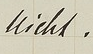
nicht.
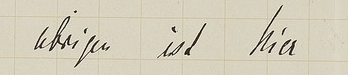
Übrigen ist hier
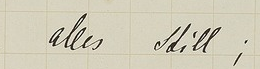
alles still;
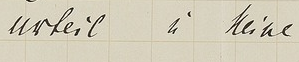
Urteil u keine
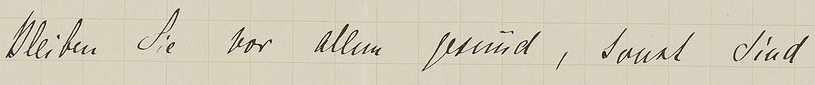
Bleiben Sie vor allem gesund, sonst sind
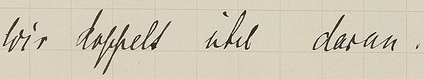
wir doppelt übel daran.
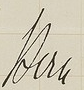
Bern
